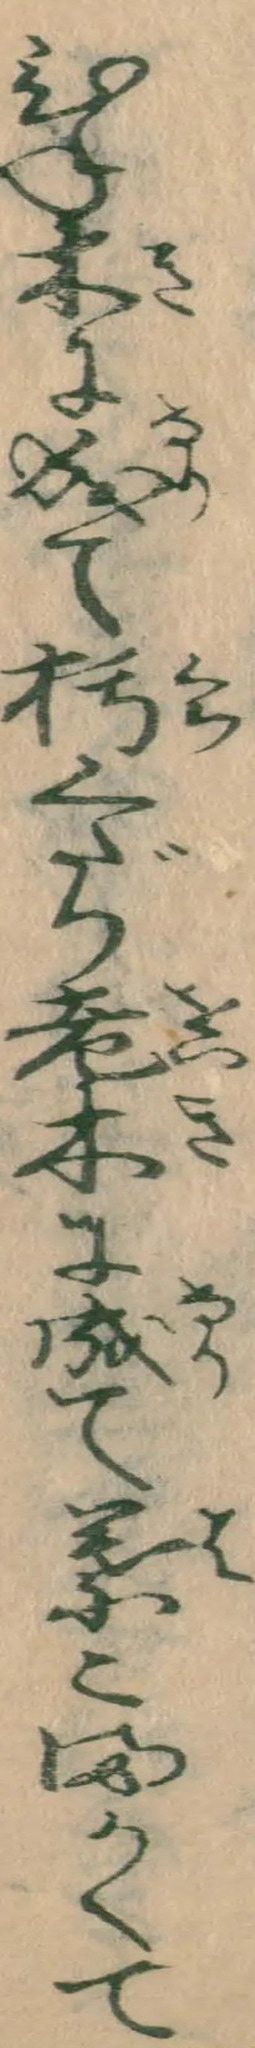ひね木に成て朽くだり老木に成て葉こまかくて

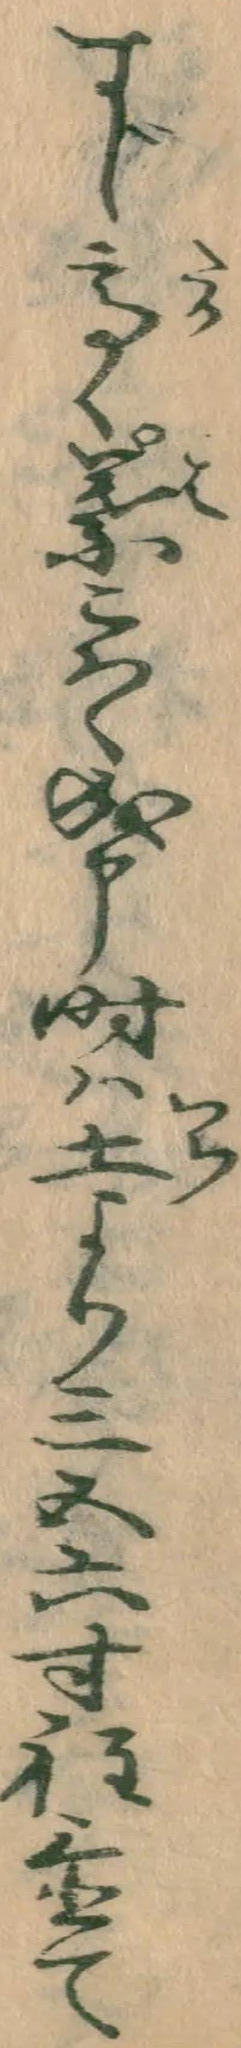すじ高く。葉こはく成申時は土より三五六寸程置て
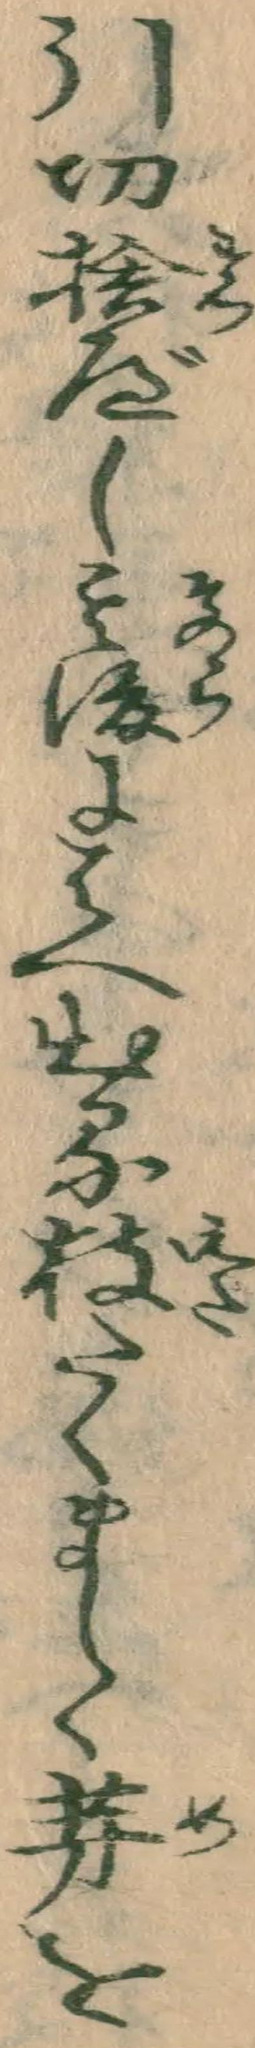引切捨べし其後にはへ出る枝たくましく芽を
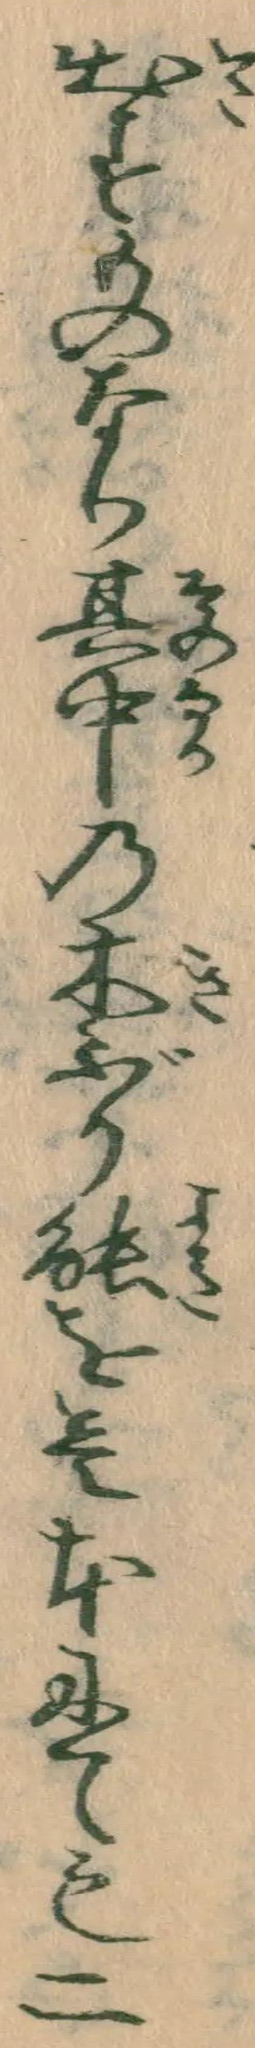出すものなり其中の木ぶり能を一本にても二
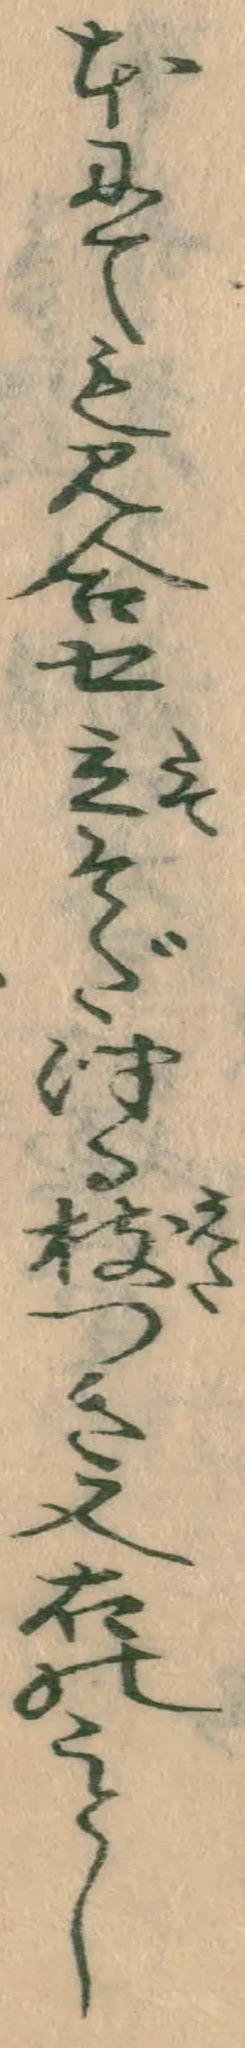本にても見合せ立そだつる枝つき又右のことし
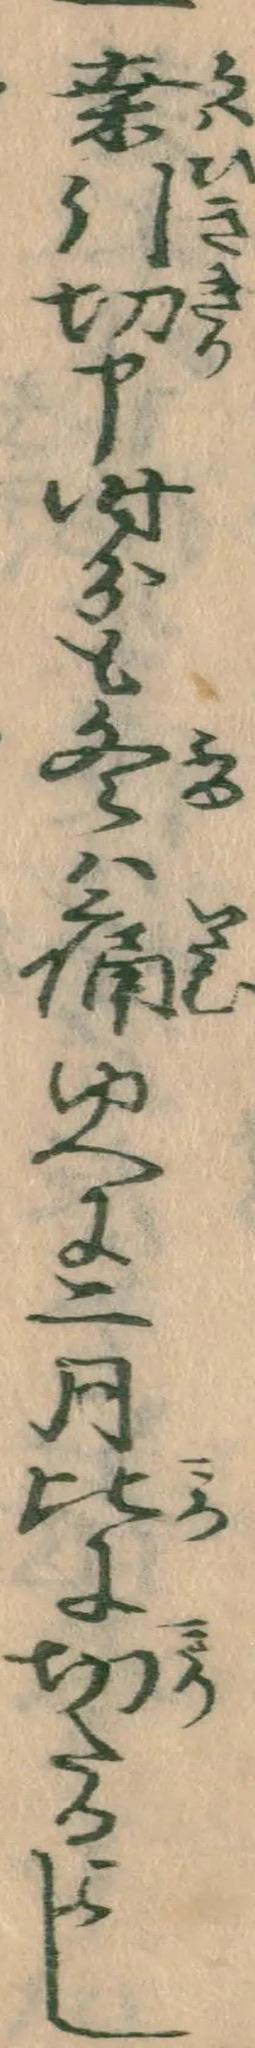一桑引切申時分も冬は痛ゆへに二月比に切たるよし
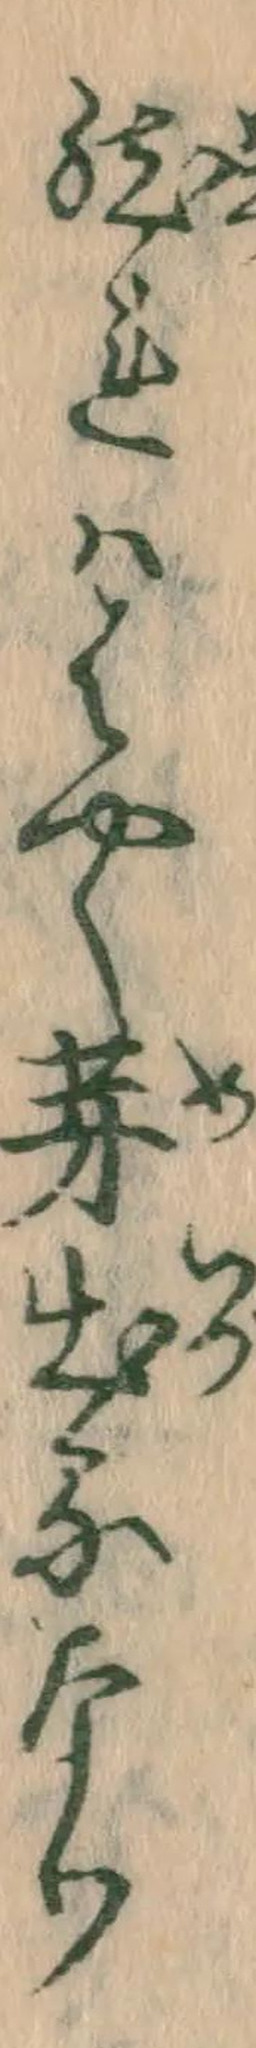然れははやく芽出るなり
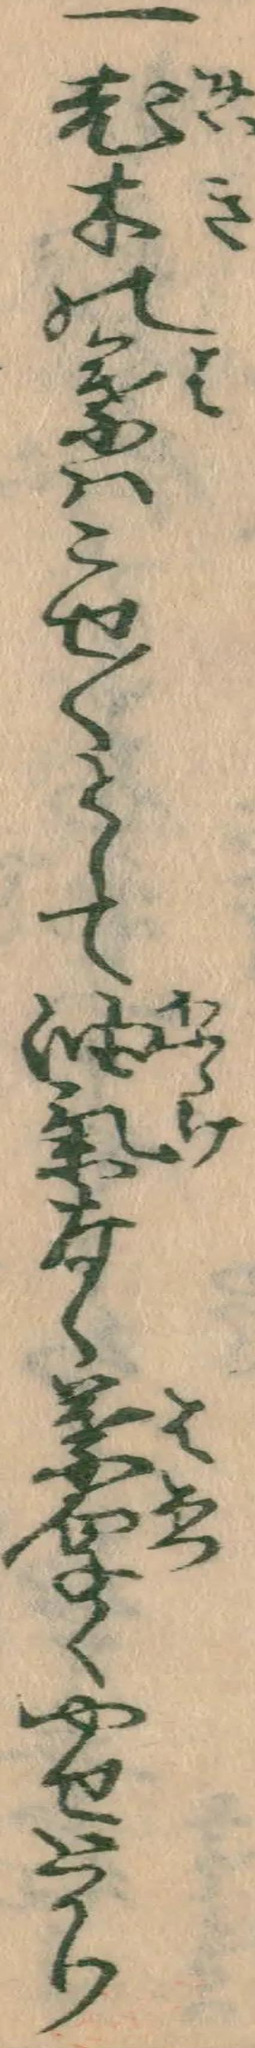一老木の葉はこせ〳〵として油気なく葉厚くやせとかり
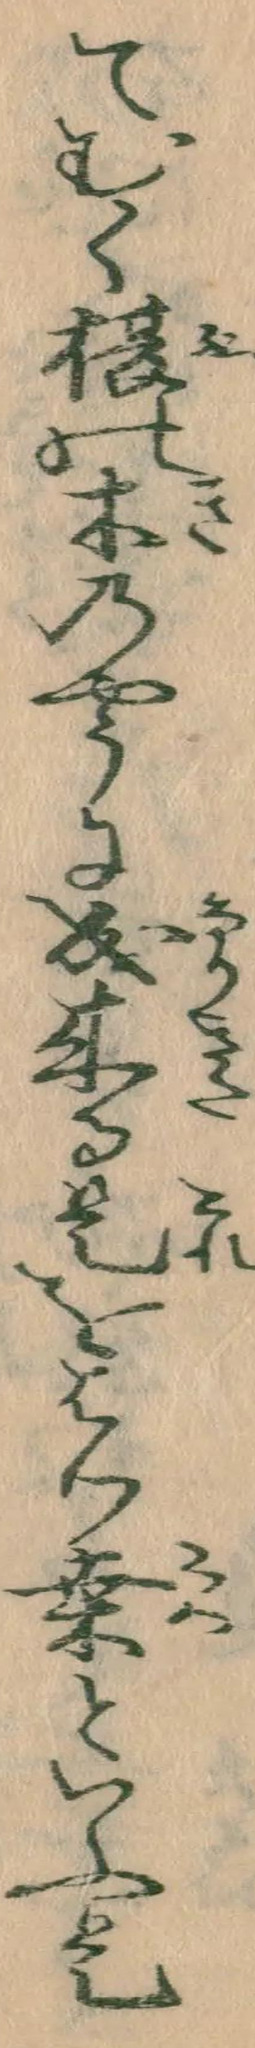てむく榎の木のやうに成来る是をはり桑といふ是
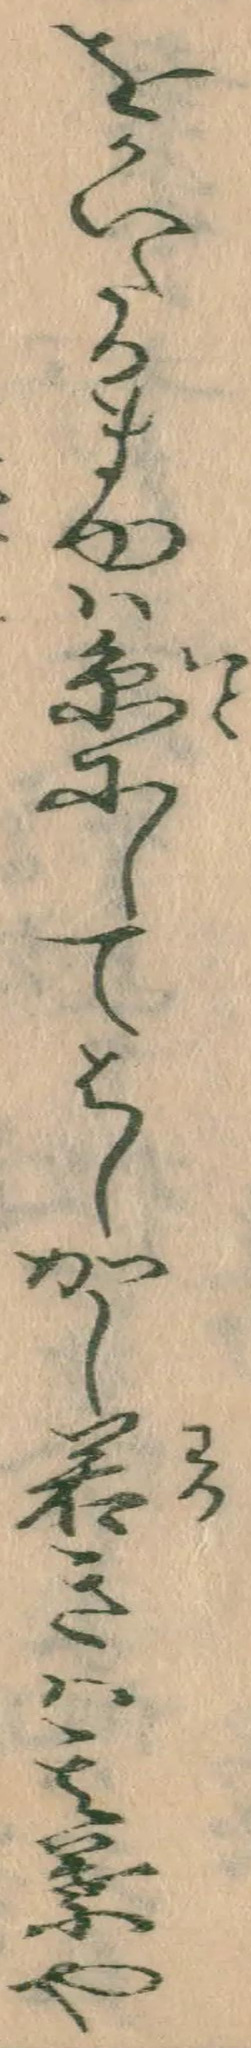をかいたるまゆは糸にしてはしかし若きは其葉や
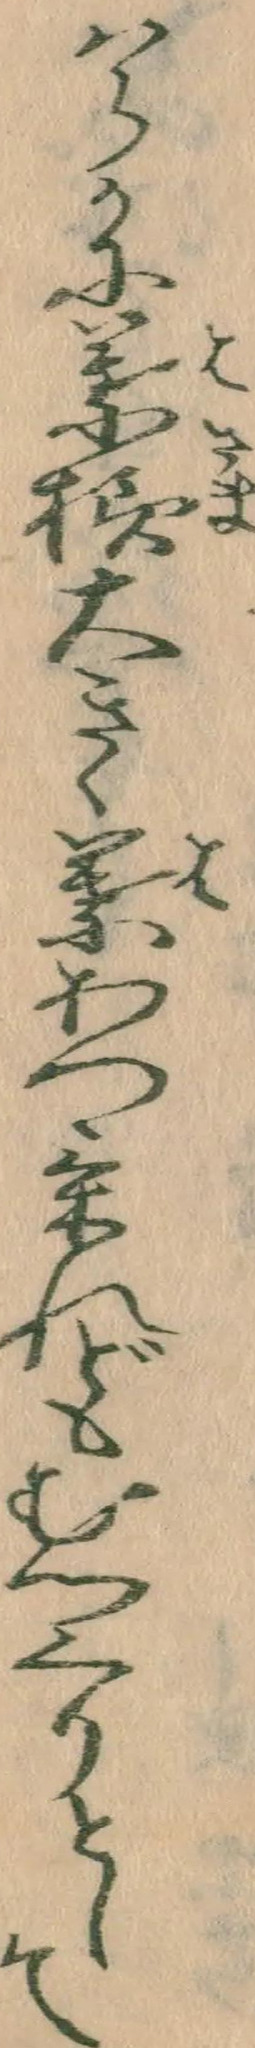はらかに葉様大きく葉あつけれどもむつくりとして
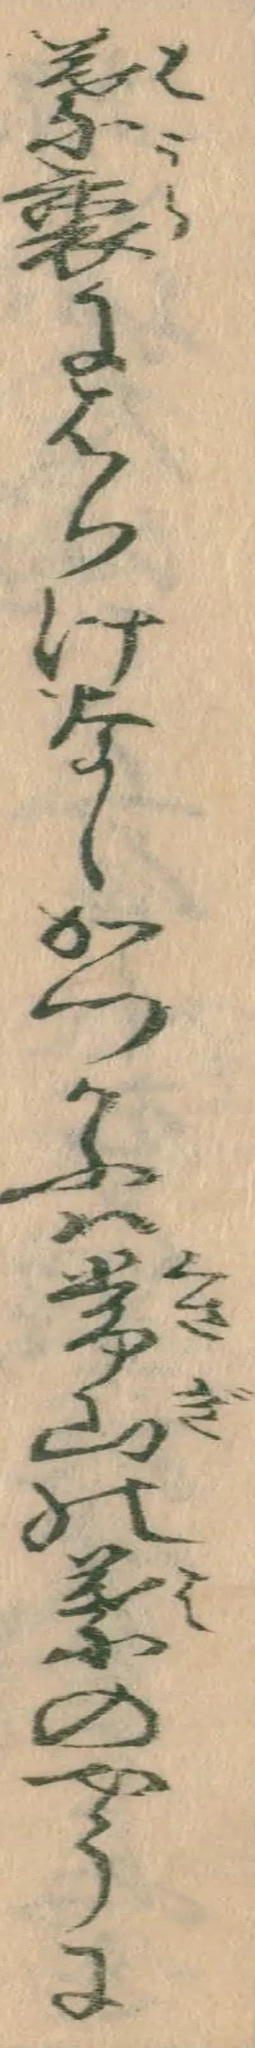葉裏にはりけなしかつかふは常山の葉のやうに
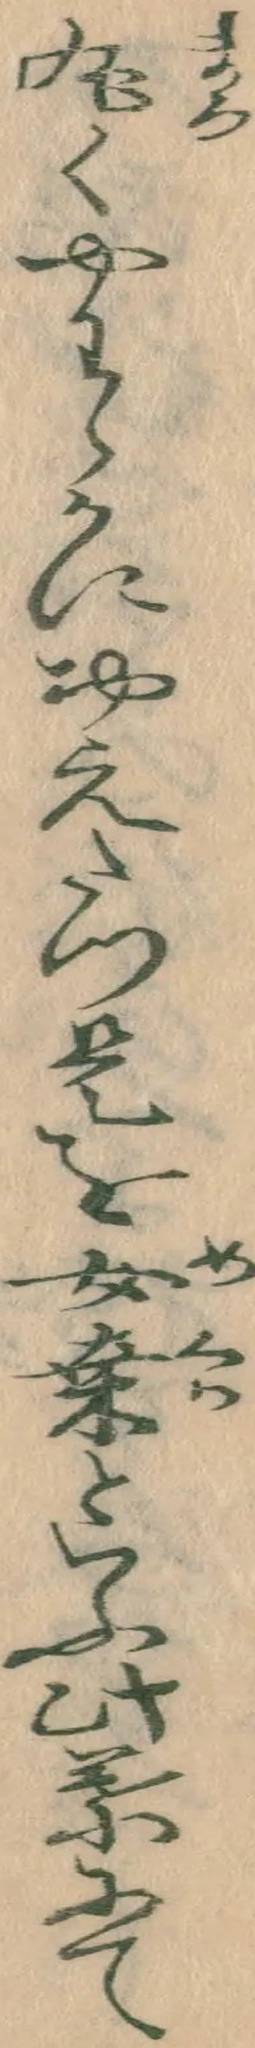丸くやわらかにおえたつ是を女桑といふ此葉にて
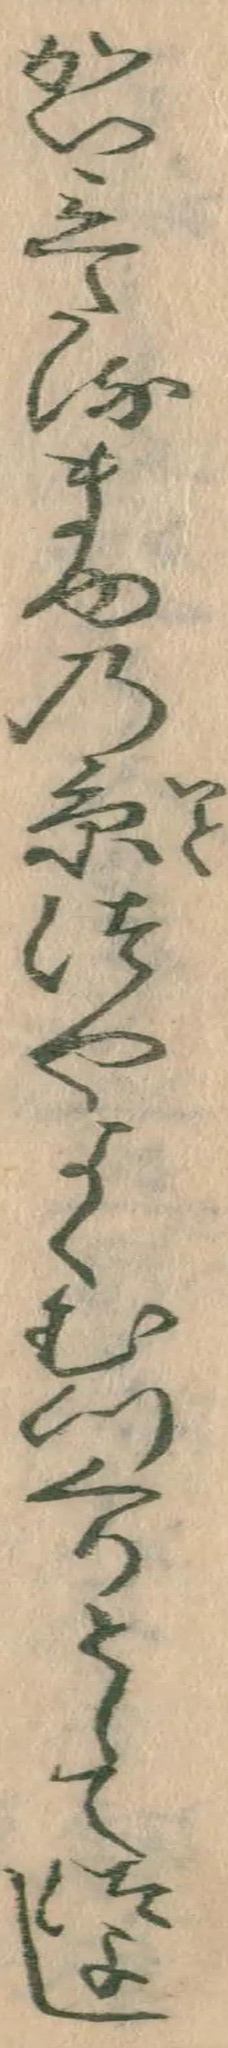かい立たるまゆの糸つやよくむつくりとしてつよし
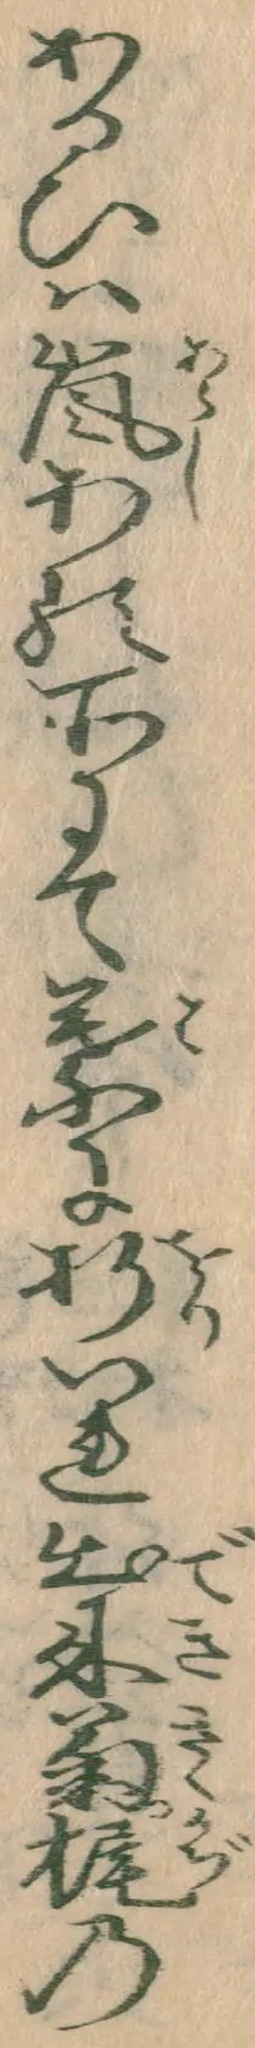あるひは嵐ある所にて葉に折いれ出来菊梶の
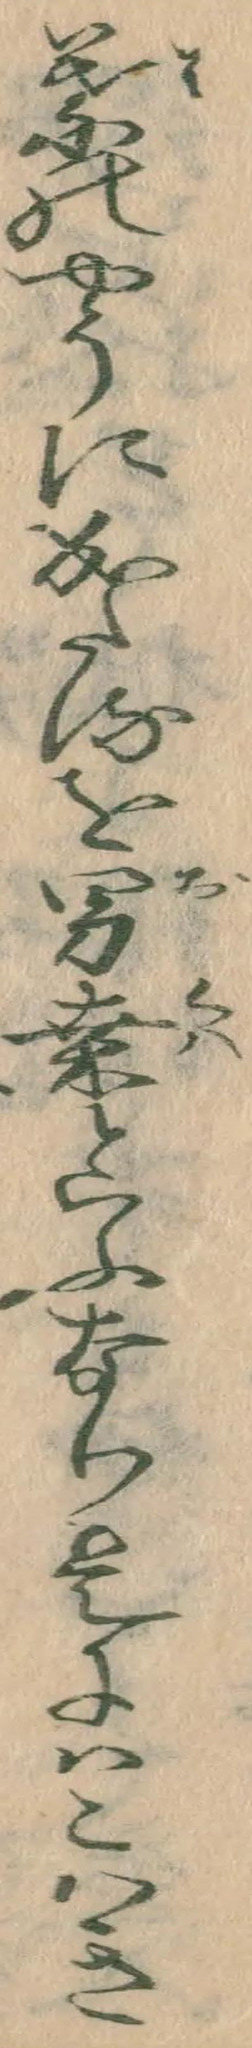葉のやうに成たるを男桑といふなり是にはこはき
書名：蚕飼養法記
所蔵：国立国会図書館 National Diet Library, JAPAN
